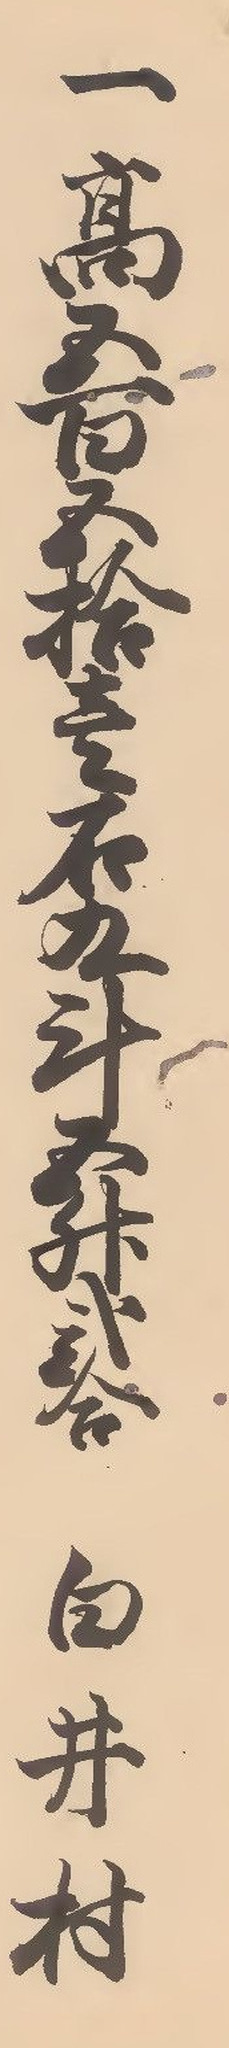一高五百五拾壱石九斗五升弐合白井村
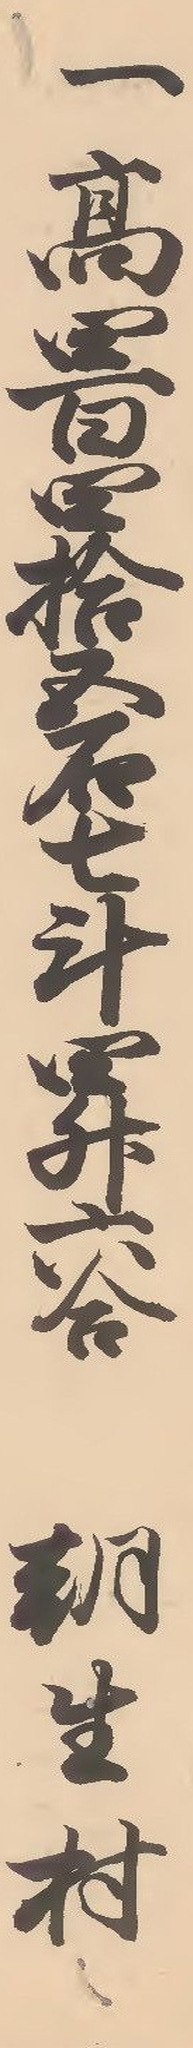一高四百四拾五石七斗四升六合朝生村
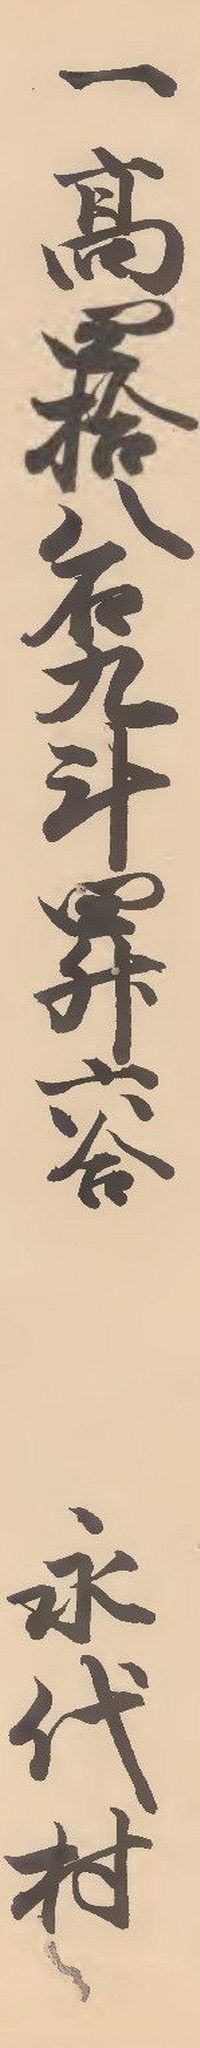一高四拾八石九斗四升六合永代村
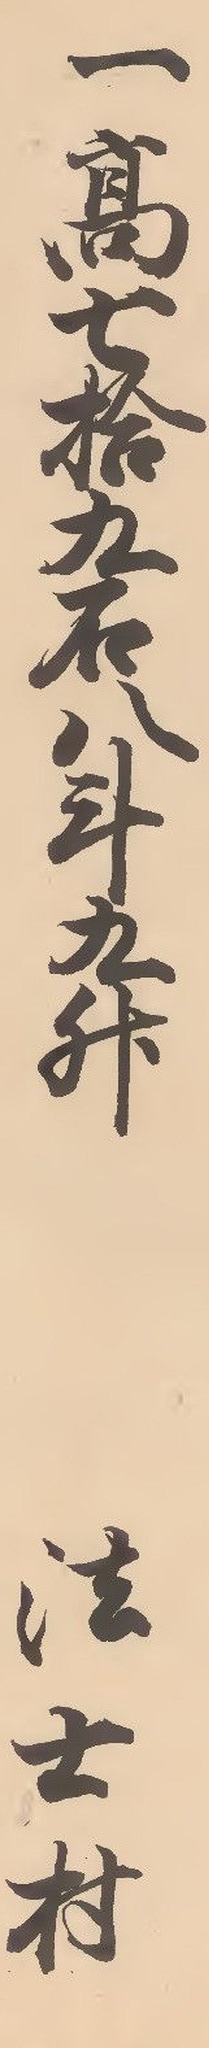一高七拾九石八斗九升法士村
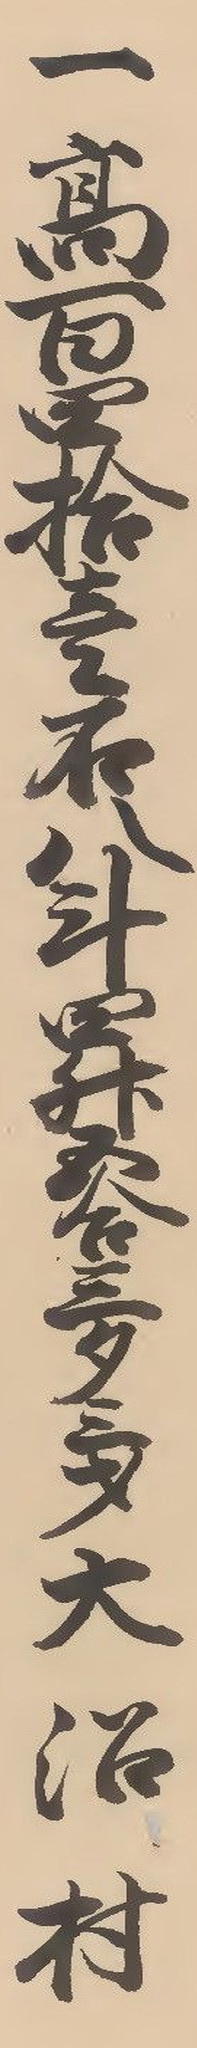一高百四拾壱石八斗四升五合三勺三才大沼村
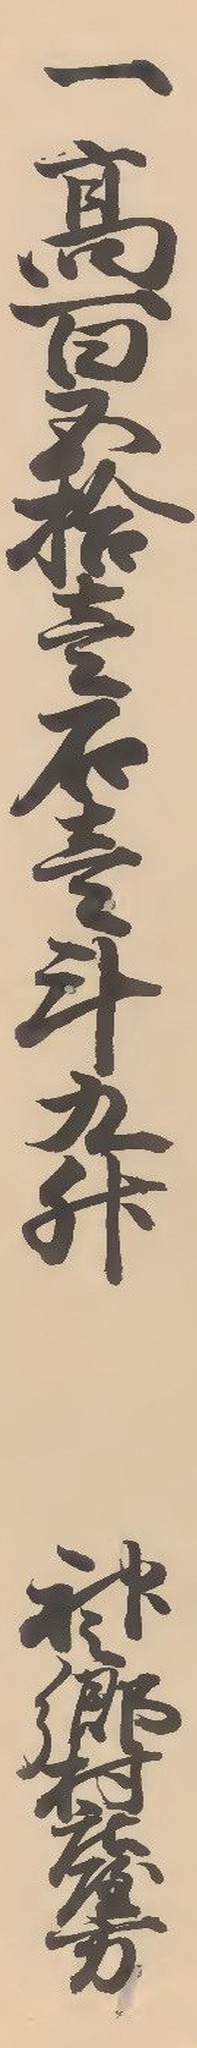一高百五拾壱石壱斗九升神之郷村庄屋方
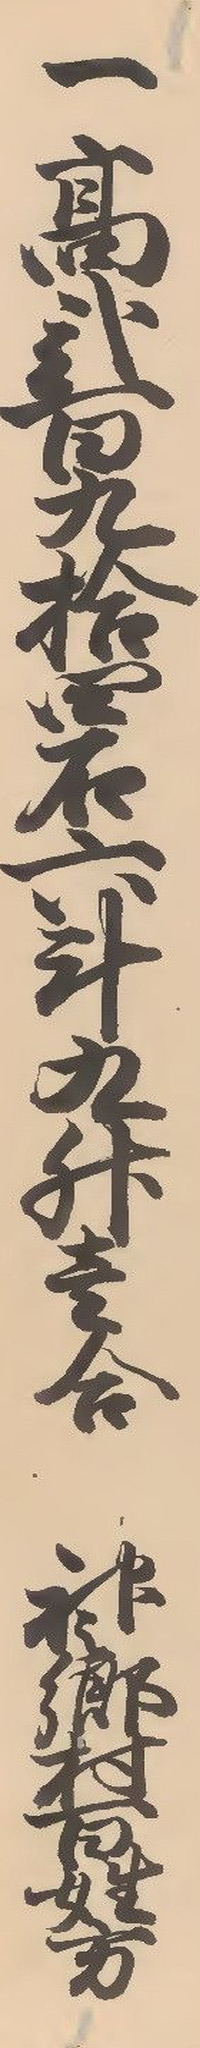一高弐百九拾四石六斗九升壱合神之郷村百姓方
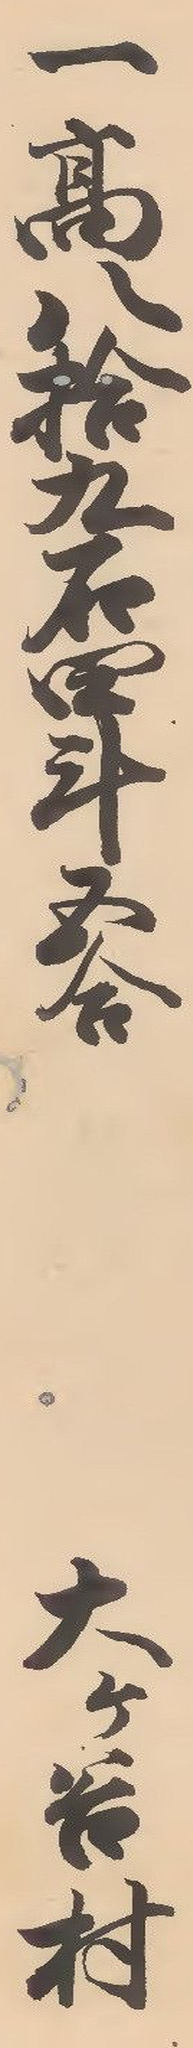一高八拾九石四斗五合大ヶ谷村

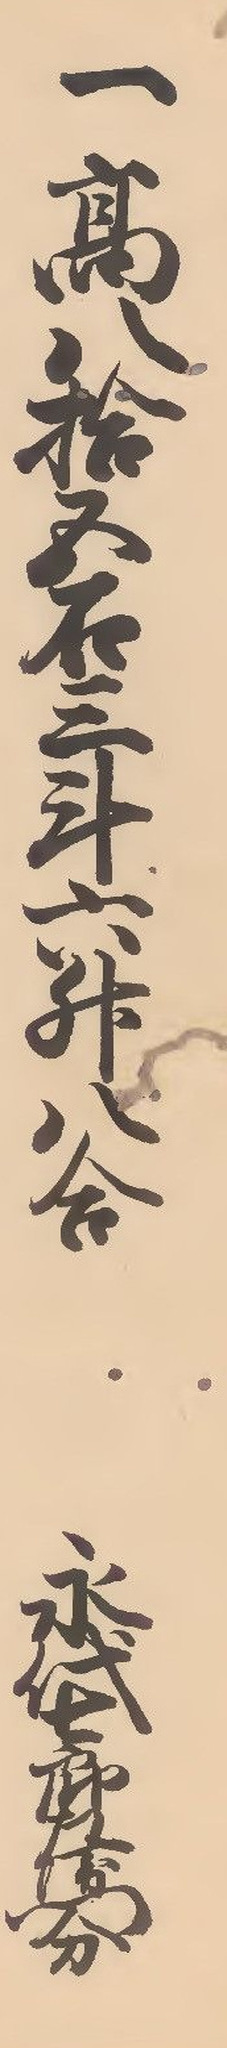一高八拾五石三斗六升八合永代七郎左衛門分
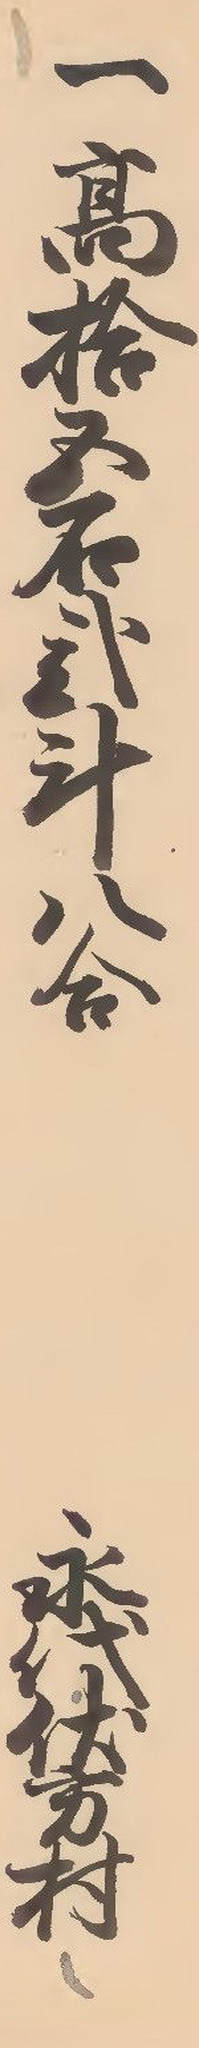一高拾五石弐斗八合永代伏方村
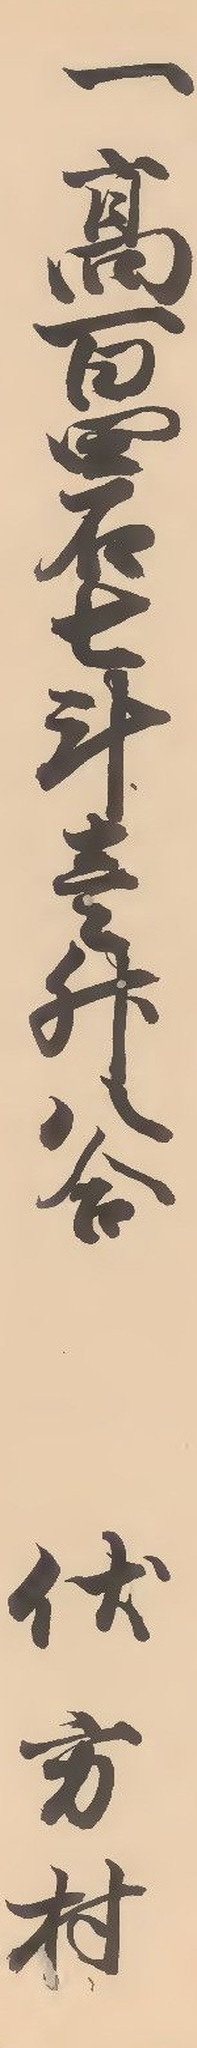一高百四石七斗壱升八合伏方村
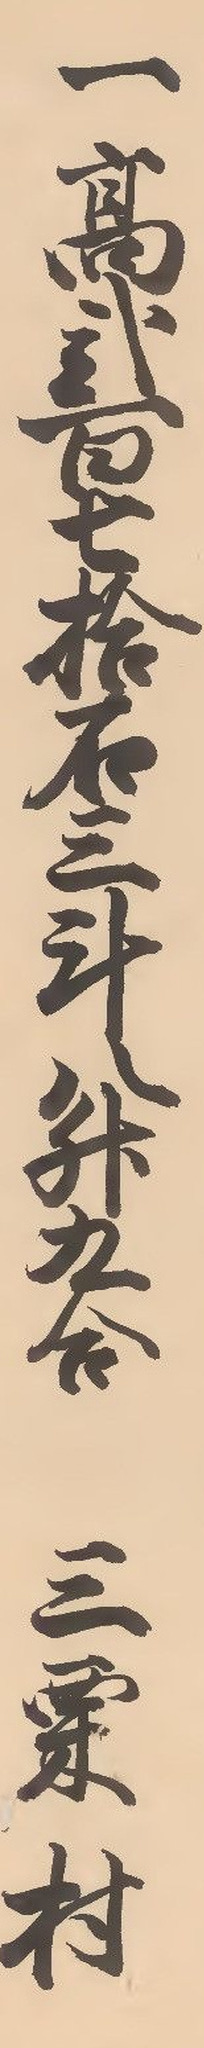一高弐百七拾石三斗八升九合三栗村
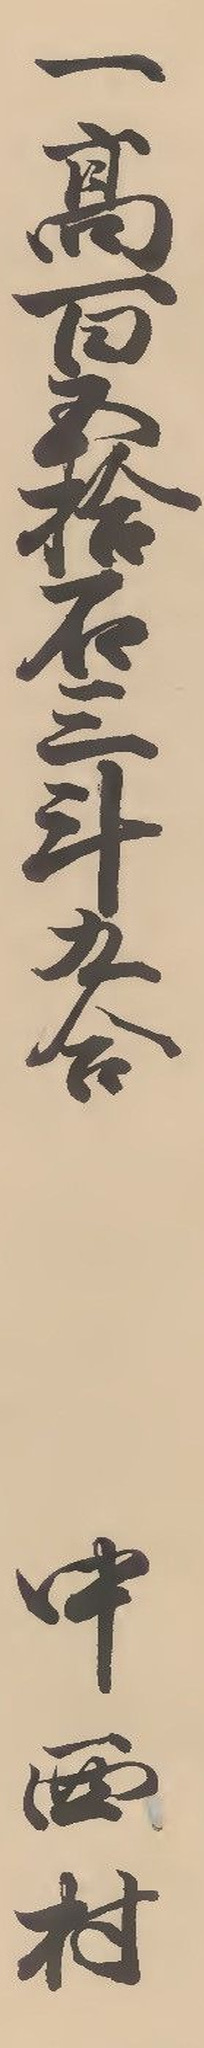一高百五拾石三斗九合中西村
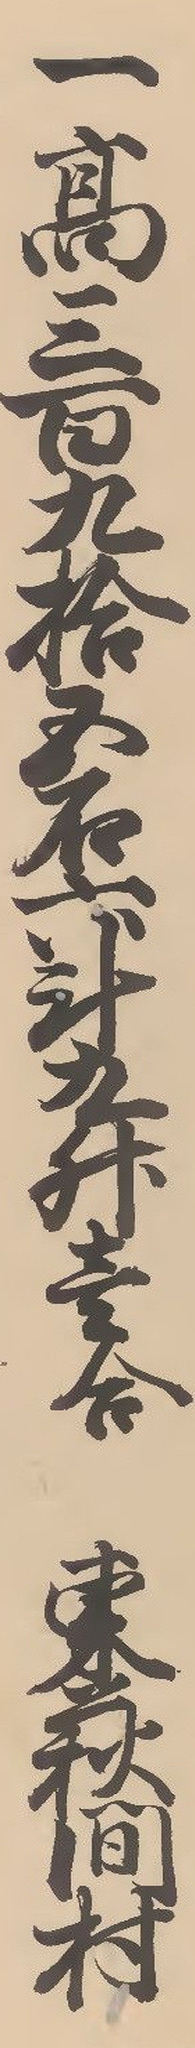一高三百九拾五石六斗九升壱合東萩間村
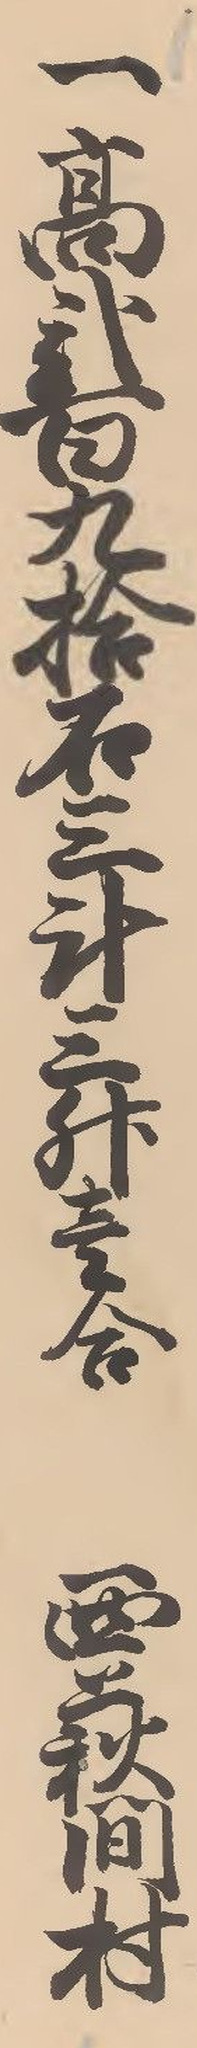一高弐百九拾石三斗三升壱合西萩間村

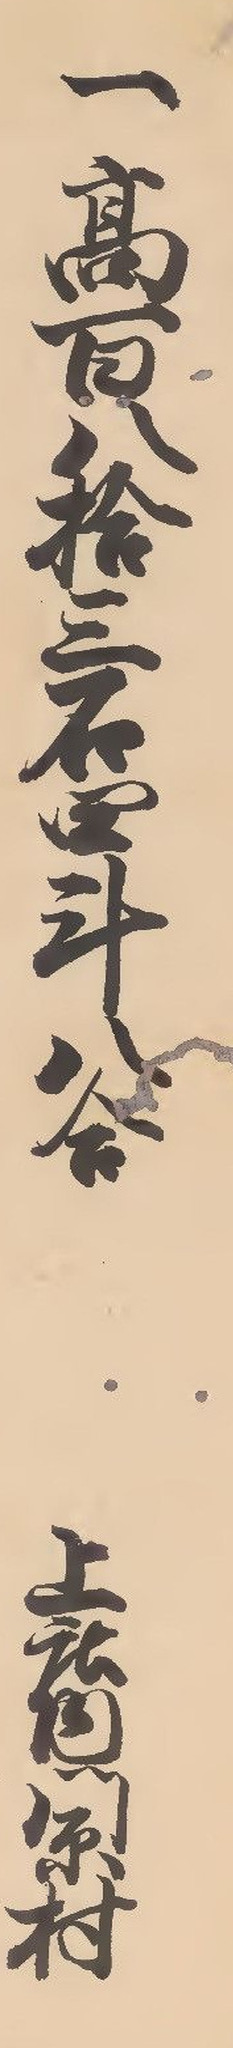一高百八拾三石四斗八合上庄内川原村
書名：遠江国郷帳
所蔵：国立公文書館 National Archives of Japan
